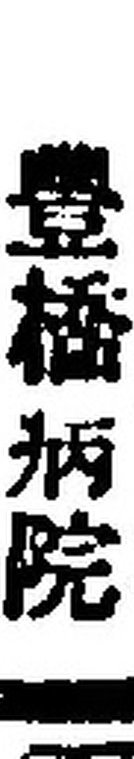豐橋病院
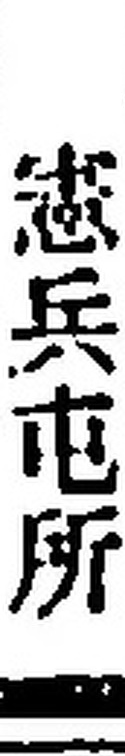憲兵屯所
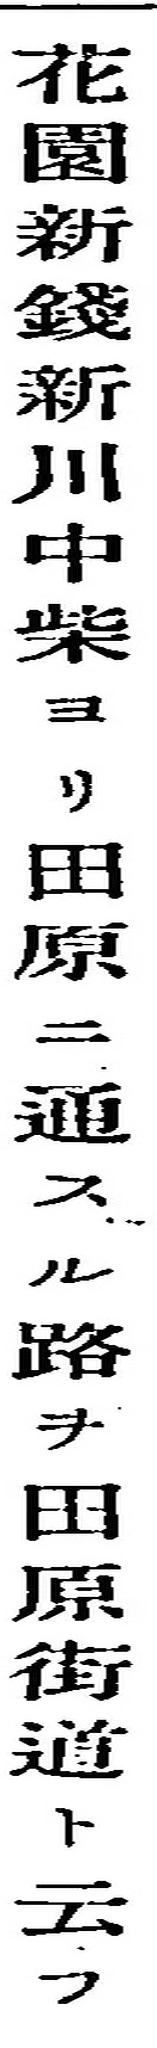花園田原花園新錢新川中柴ヨリ田原ニ通スル路ヲ田原街道ト云フ
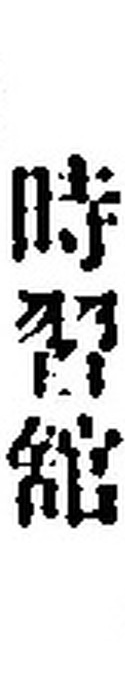時習舘
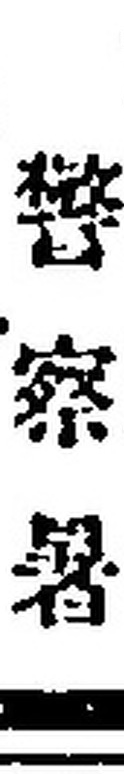警察署
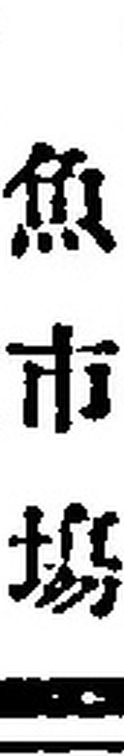魚市場
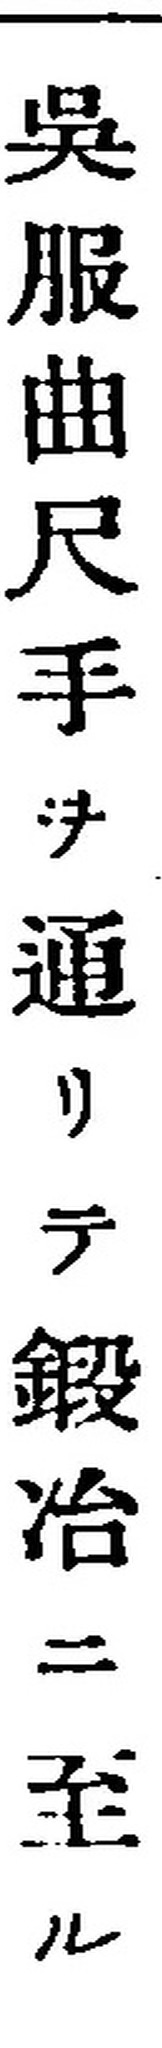呉服呉服曲尺手ヲ通リテ鍛冶ニ至ル
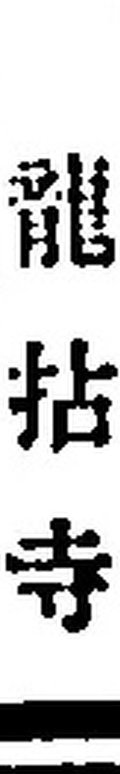龍拈寺
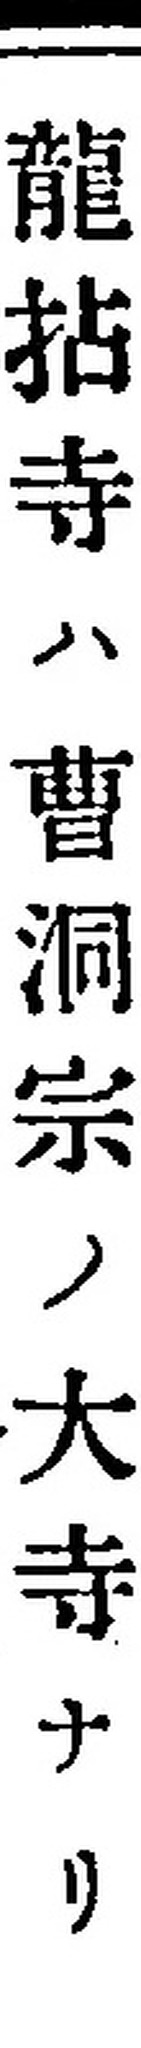手間龍拈寺ハ曹洞宗ノ大寺ナリ
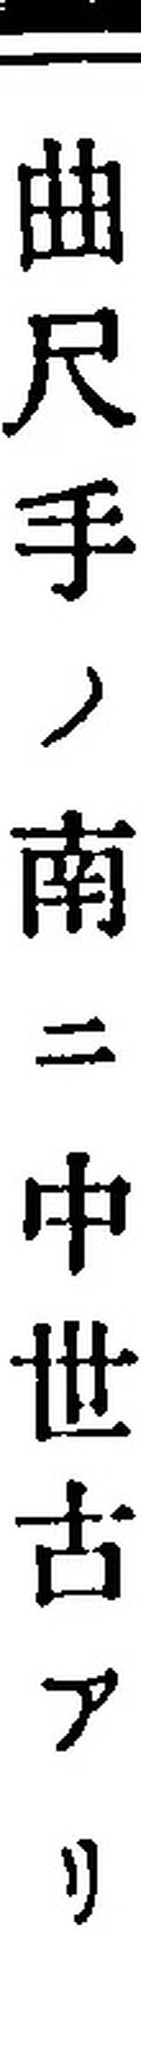曲尺手曲尺手ノ南ニ中世古アリ
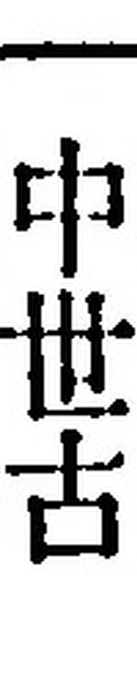中世古

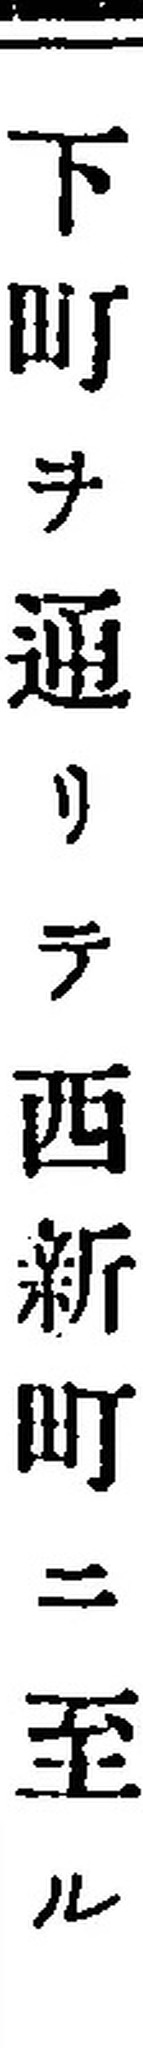下町下町ヲ通リテ西新町ニ至ル
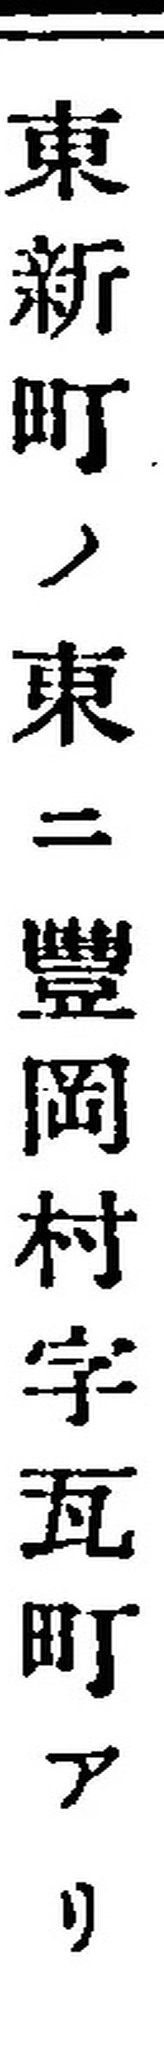用水東新町ノ東ニ豐岡村字瓦町アリ
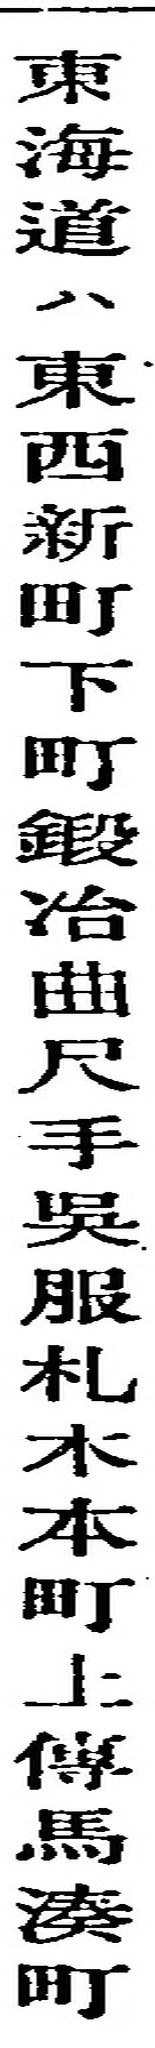東西新町東海道ハ東西新町下町鍛冶曲尺手呉服札木本町上傳馬湊町
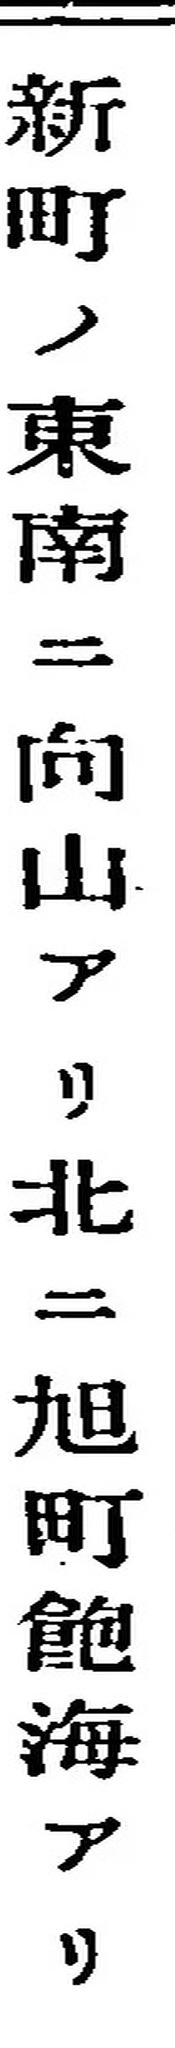向山新町ノ東南ニ向山アリ北ニ旭町飽海アリ
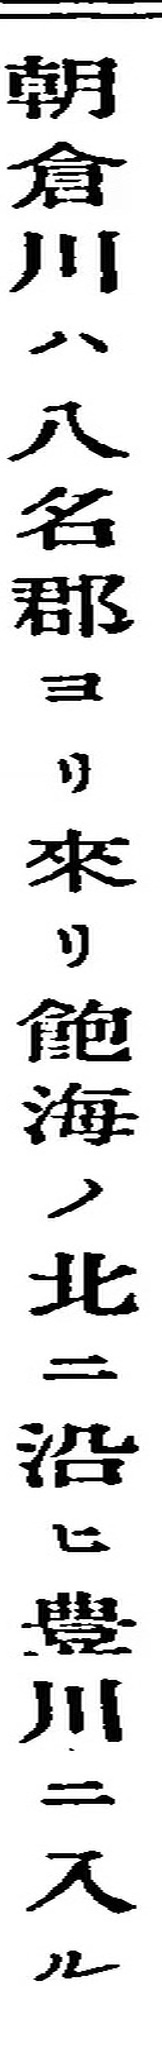朝倉川朝倉川ハ八名郡ヨリ來リ飽海ノ北ニ沿ヒ豊川ニ入ル
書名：郷土誌
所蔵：国立国会図書館 National Diet Library, JAPAN
